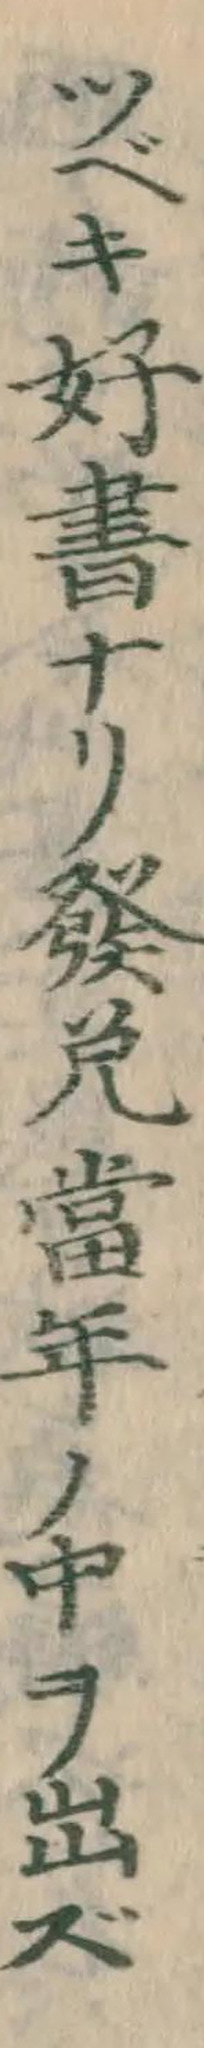ツベキ好書ナリ発兌当年ノ中ヲ出ズ
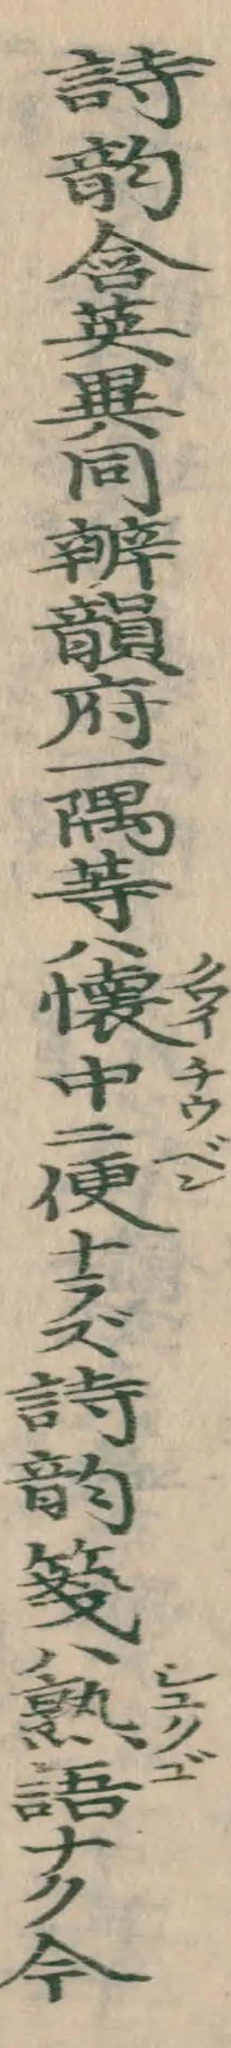詩韵含英異同弁韻府一隅等ハ懐中ニ便ナラズ詩韵箋ハ熟語ナク今
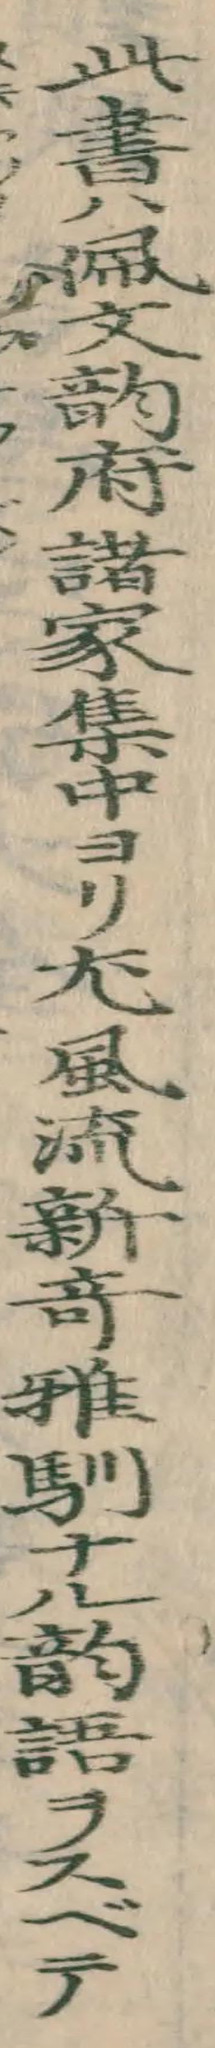此書ハ佩文韵府諸家集中ヨリ尤風流新奇雅馴ナル韵語ヲスベテ
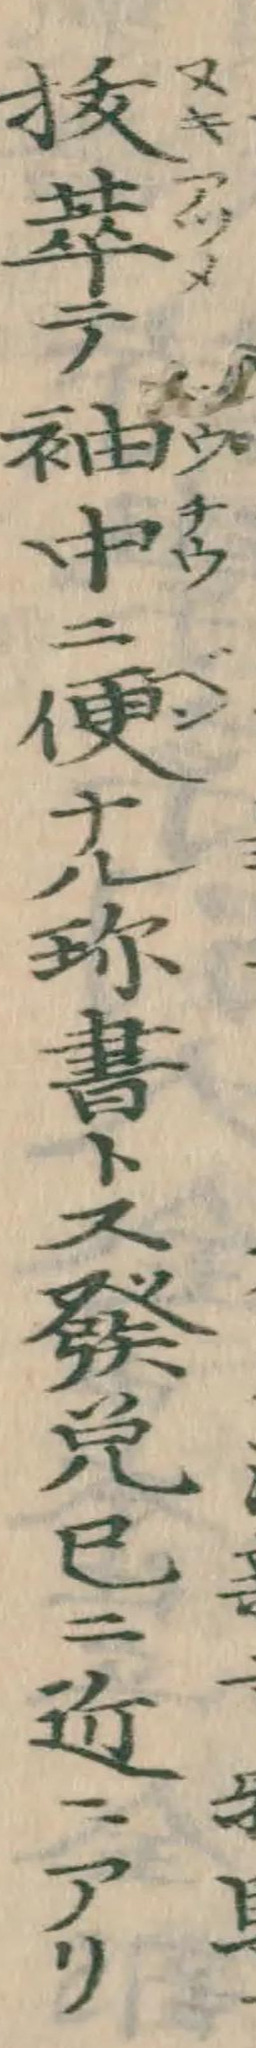抜萃テ袖中ニ便ナル珍書トス発兌巳ニ近アリ
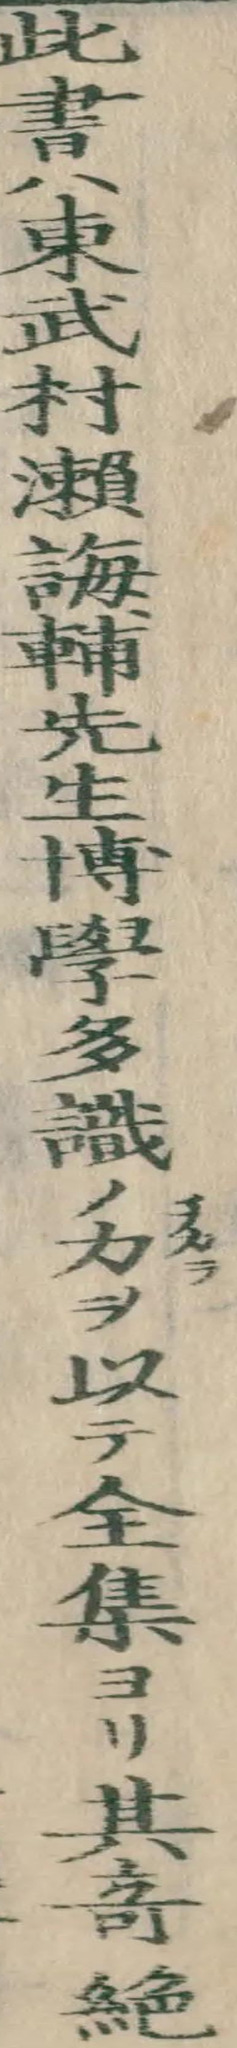此書ハ東武村瀬誨輔先生博学多識ノ力ヲ以テ全集ヨリ其奇絶
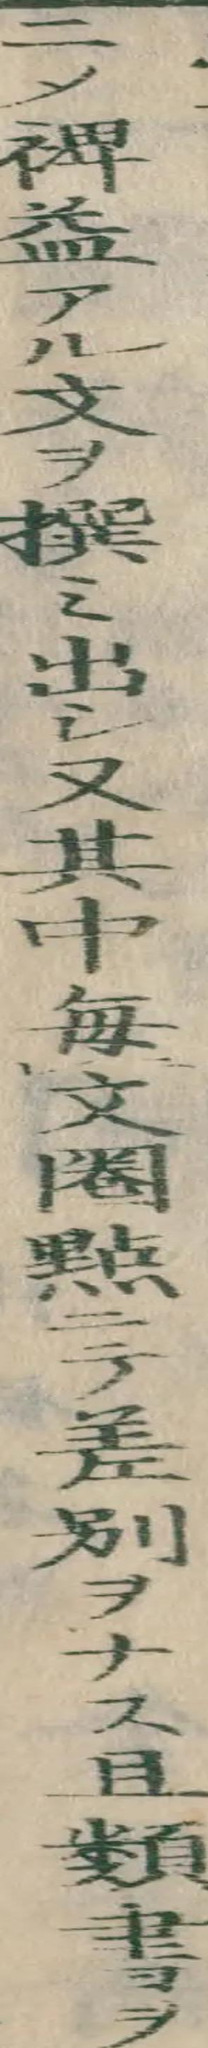ニシテ裨益アル文ヲ撰ミ出シ又其中毎文圏点ニテ差別ヲナス且類書ヲ
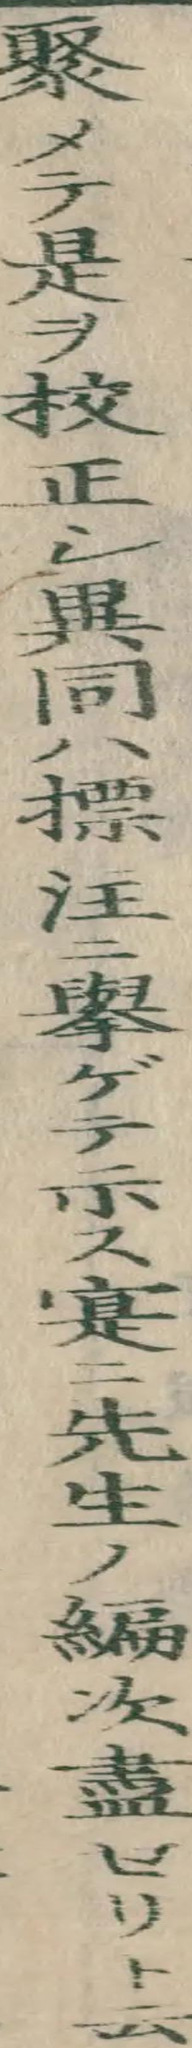聚メテ是ヲ校正シ異同ハ摽汪ニ挙ゲテ示ス寔ニ先生ノ編次尽セリト云
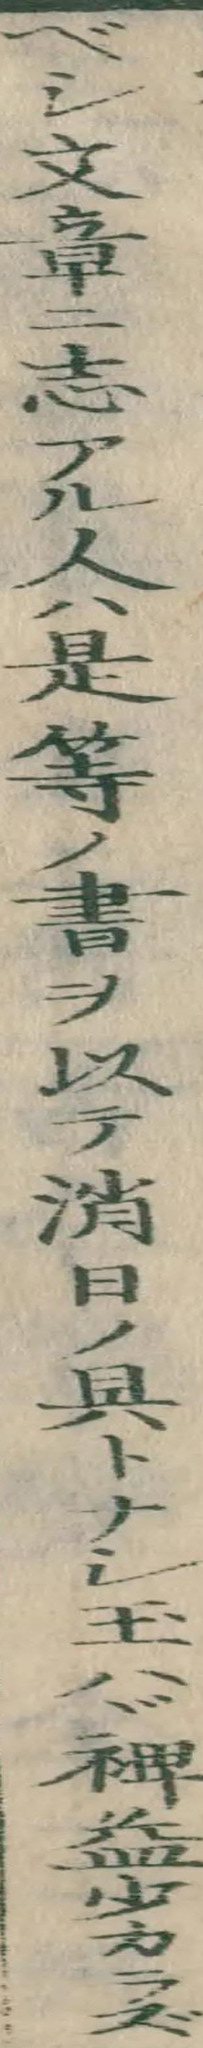ベシ文章ニ志アル人ハ是等ノ書ヲ以テ消日ノ具トナシ玉ハヾ裨益少カラズ
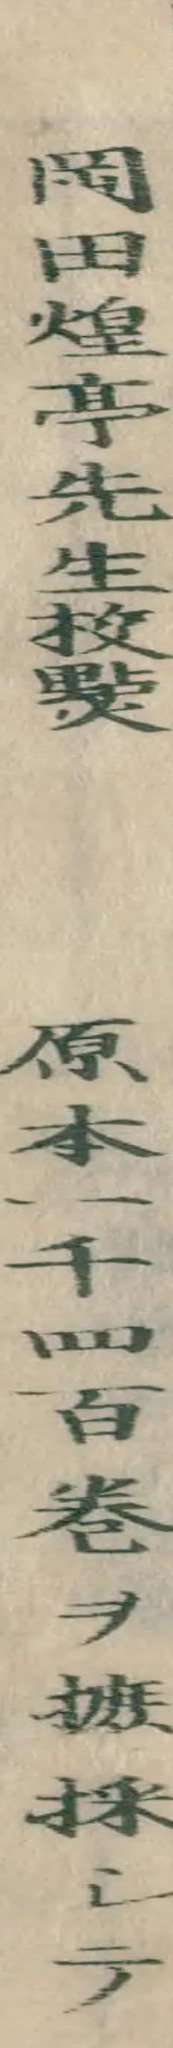岡田煌亭先生校点原本一千四百巻ヲ採シテ
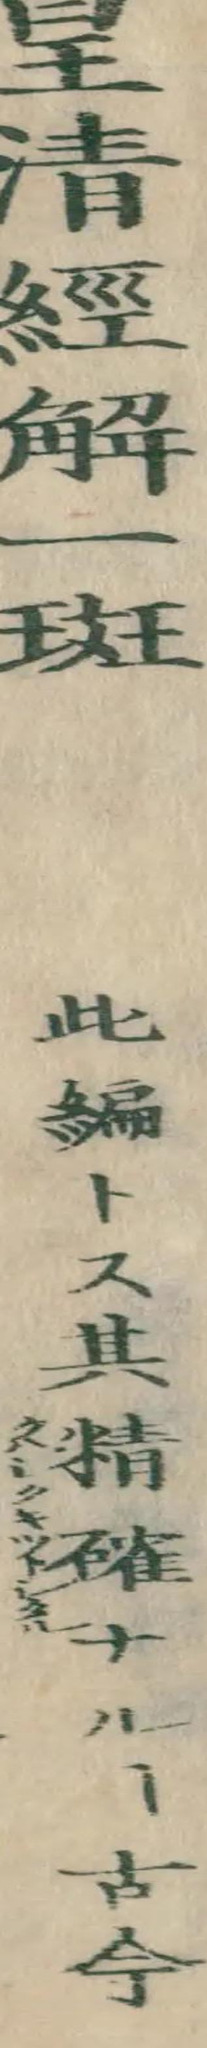皇清経解一斑此編トス其精確ナルコト古今
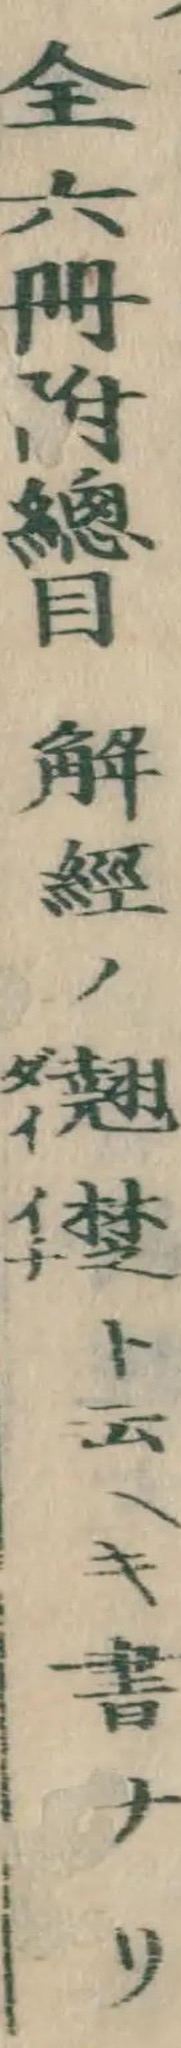全六冊附総目解経ノ翹楚ト云ヘキ書ナリ

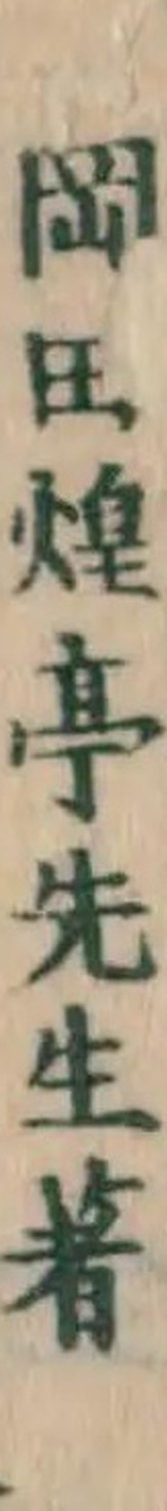岡田煌亭先生著
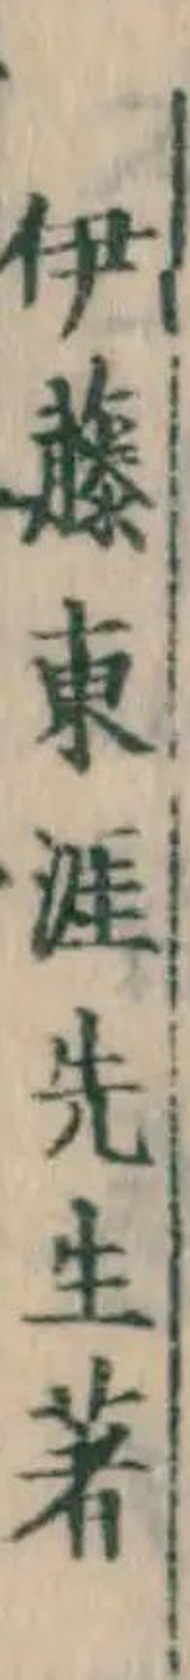伊藤東涯先生著
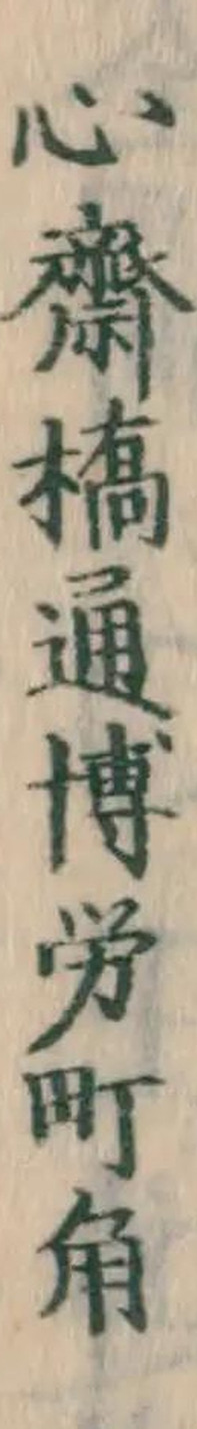心斎橋通博労町角
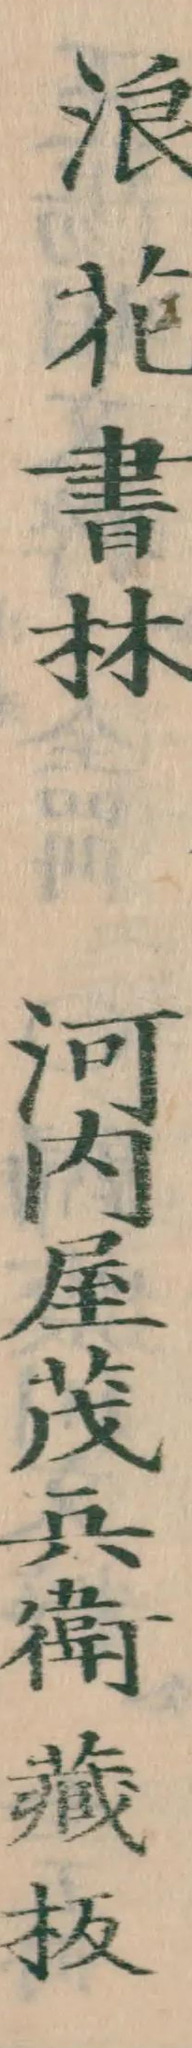浪花書林河内屋茂兵衛蔵板
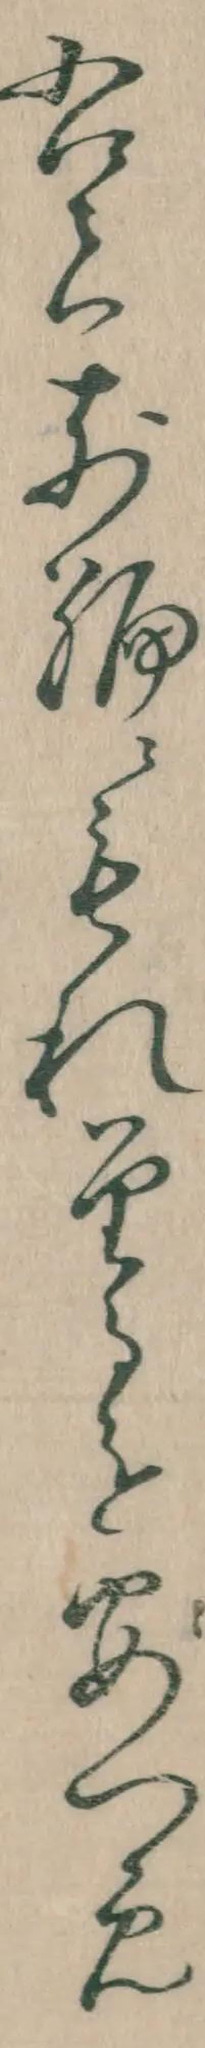右は前編もれたるをあつめ
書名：これこれ草 2巻. [2]
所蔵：国立国会図書館 National Diet Library, JAPAN
